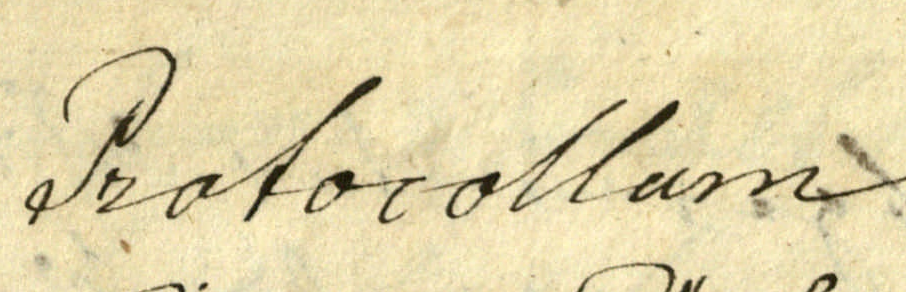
Protocollum
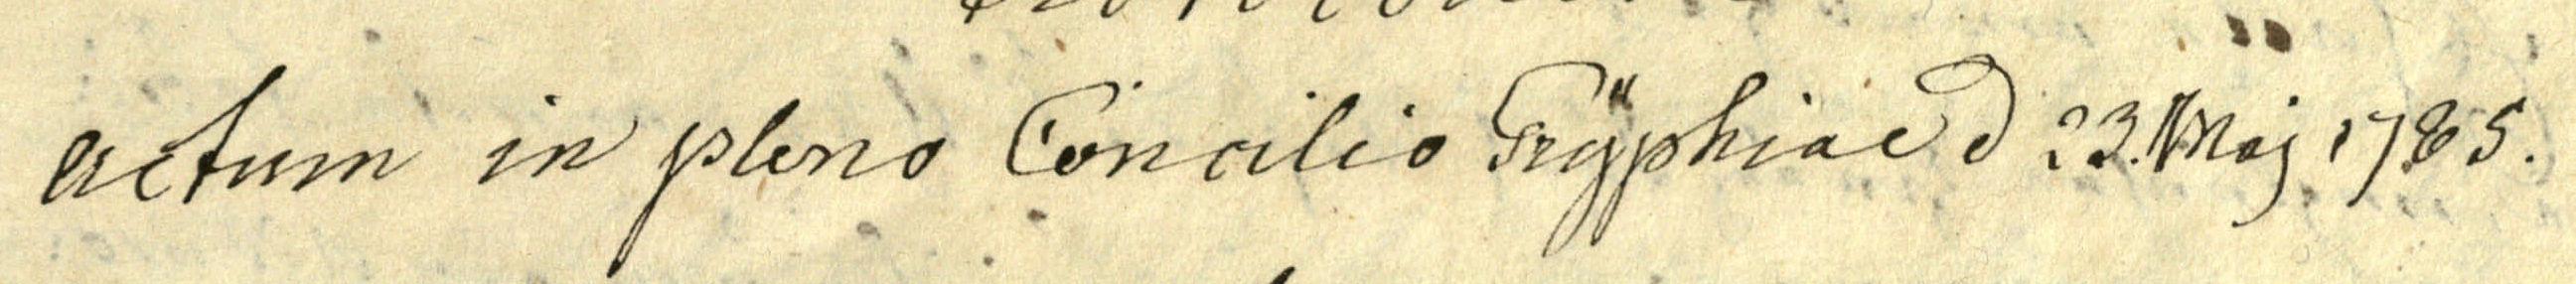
Actum in pleno Concilio Grÿphiae d. 3. Maj 1785.
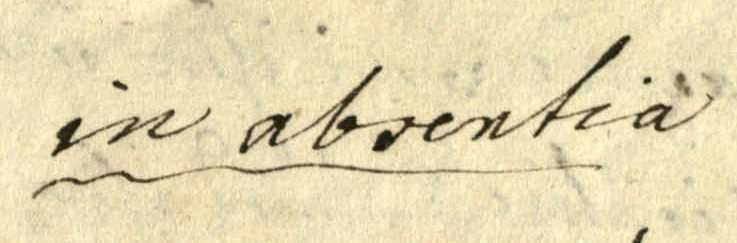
in absentia
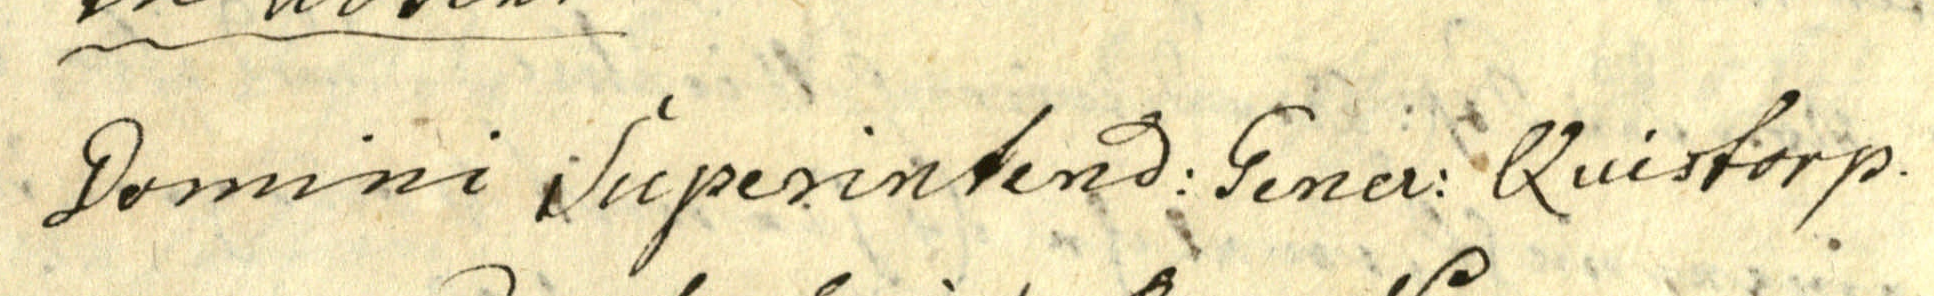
Domini Superintend. Gener. Quistorp.
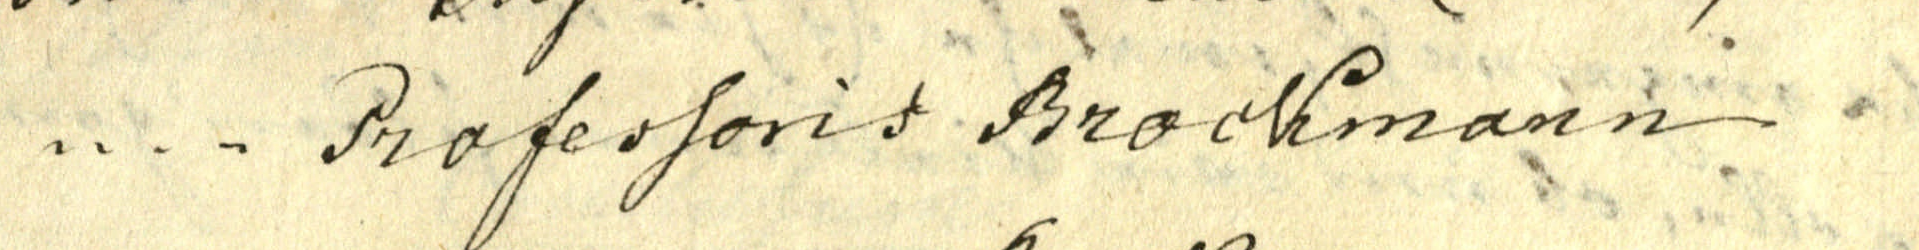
Professoris Brockmann.
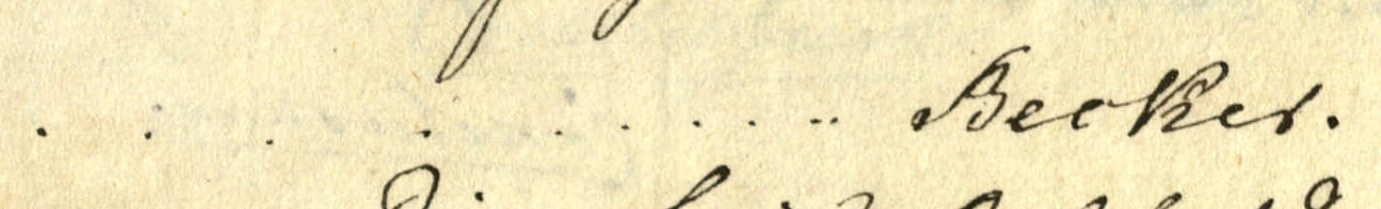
Becker.
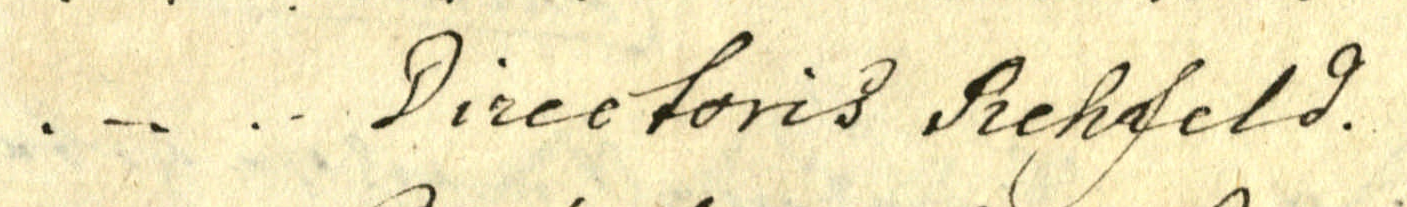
Directoris Rehfeld.
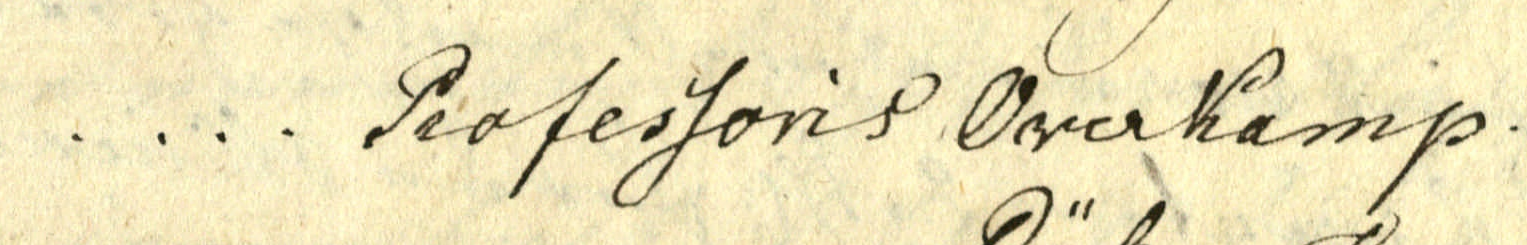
Professors Overkamp.
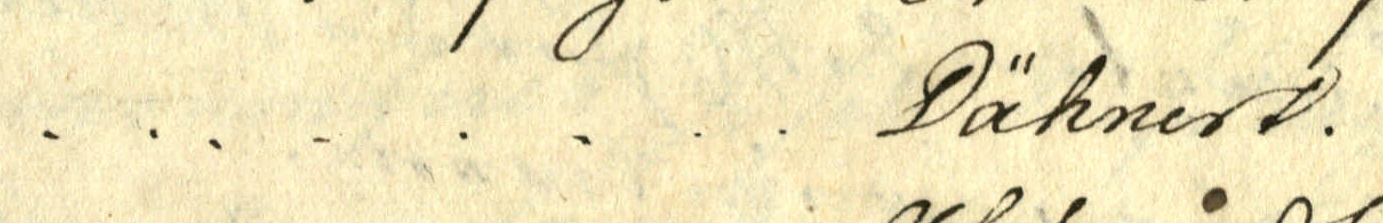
Dähnert.
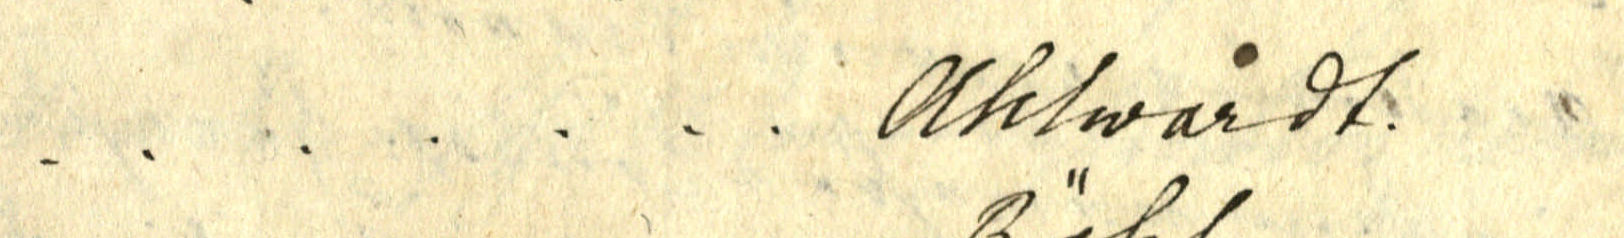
Ahlwardt.
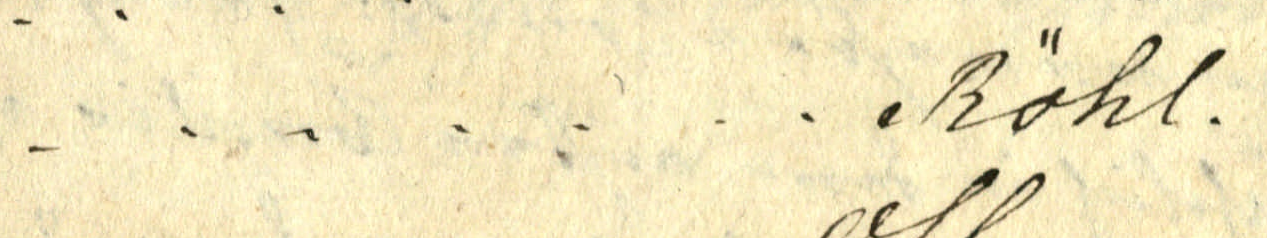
Röhl.
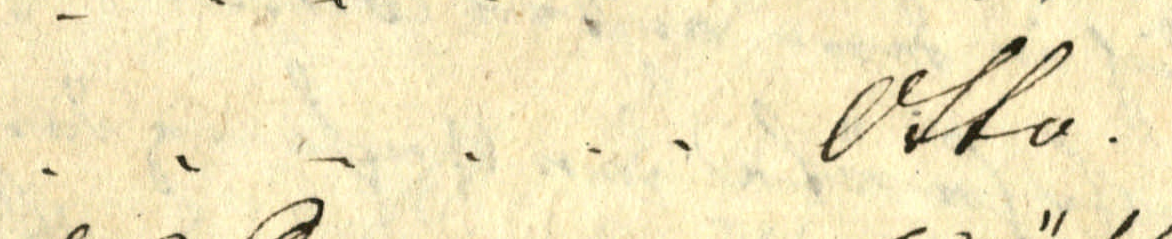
Otto.
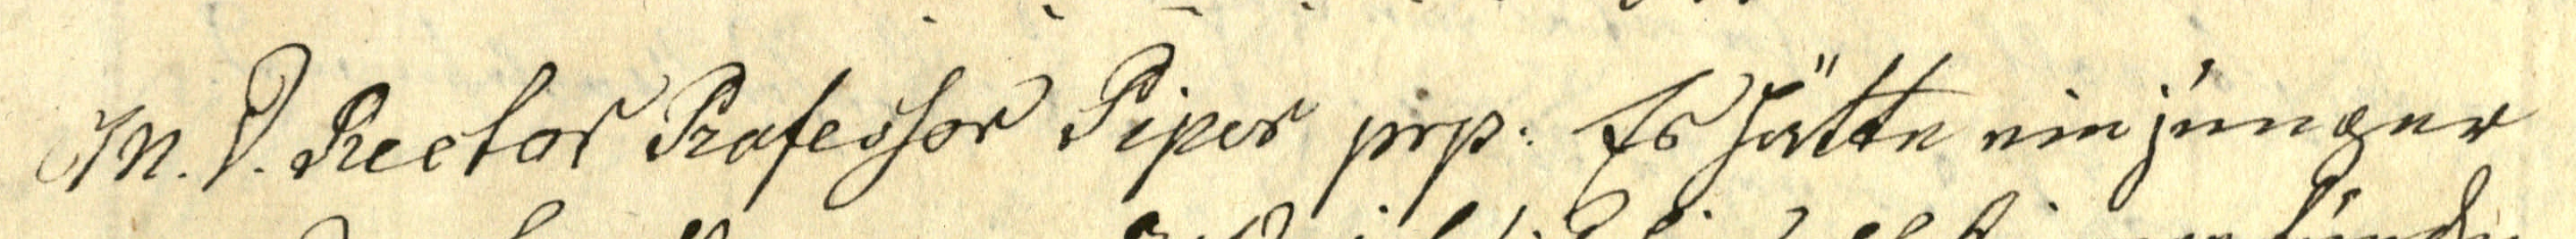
M. D. Rector Professor Piper prp. Es hätte ein junger
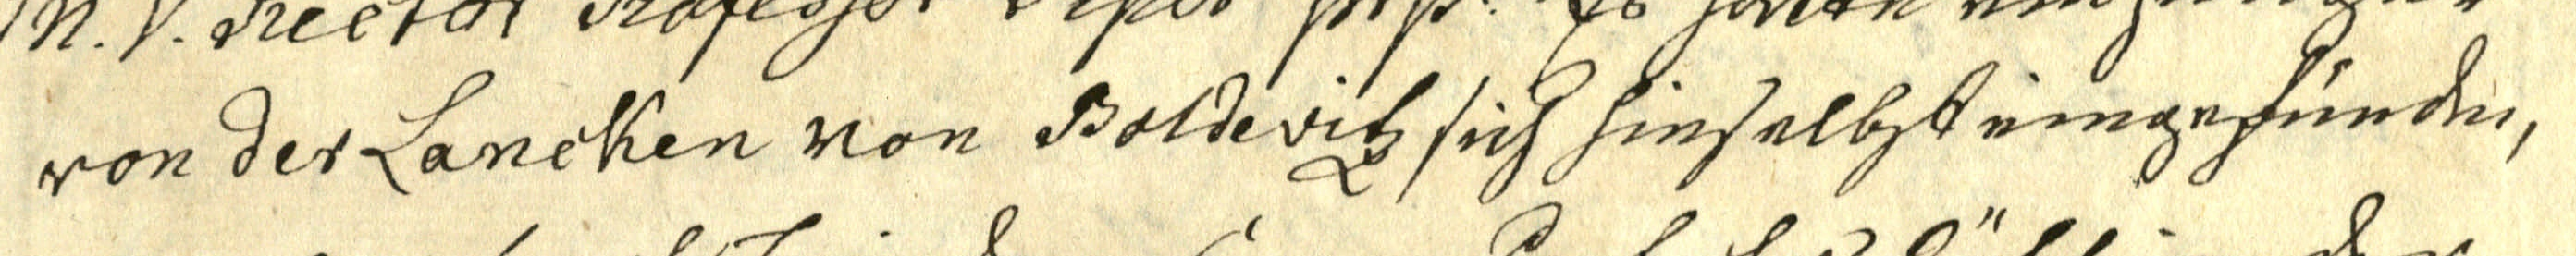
von der Lancken von Boldevitz sich hieselbst eingefunden,
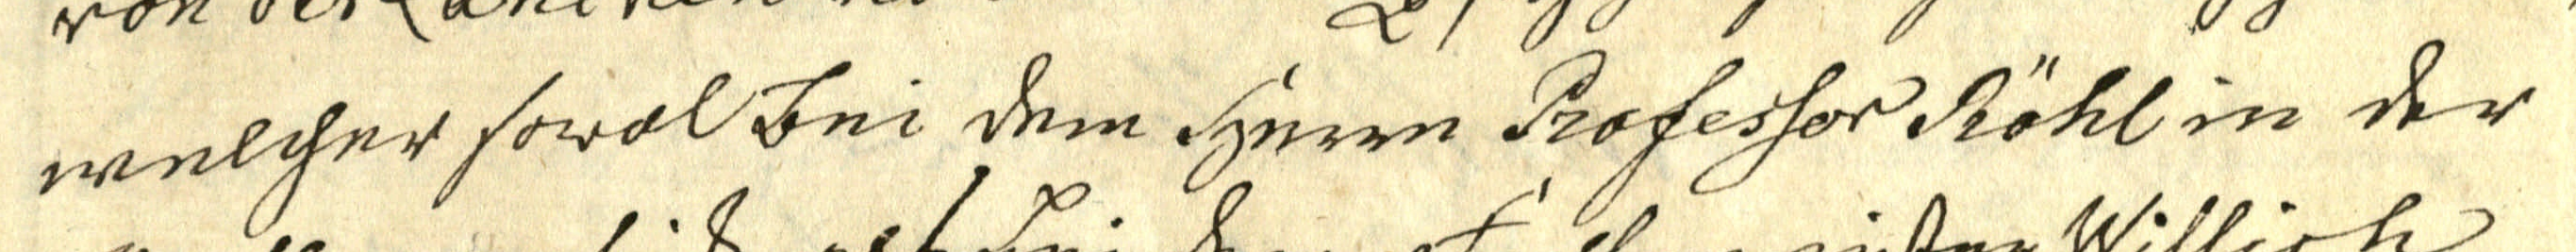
welcher sowohl bei dem Herrn Professor Röhl in der
